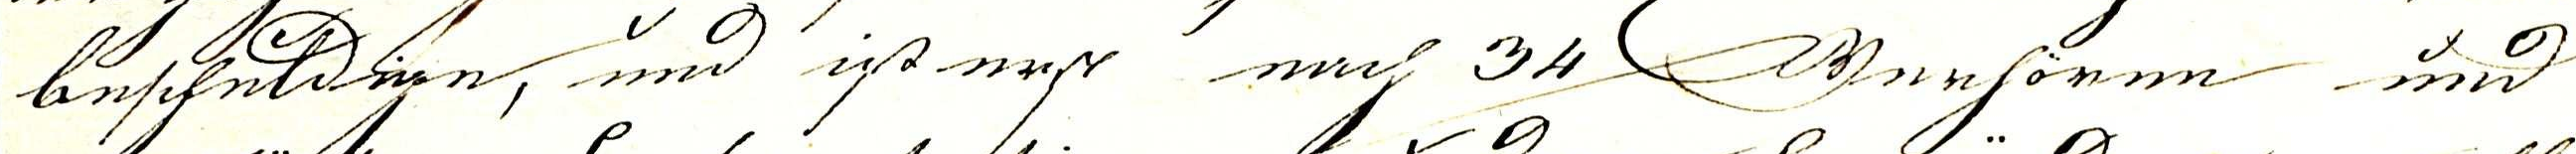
beschuldige, und ist erst nach 34 Verhören und
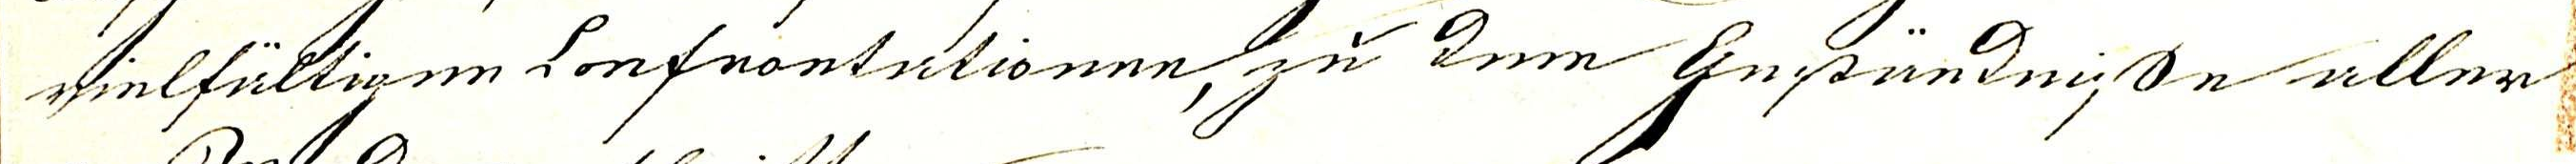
vielfältigen Confrontationen, zu dem Geständniße aller
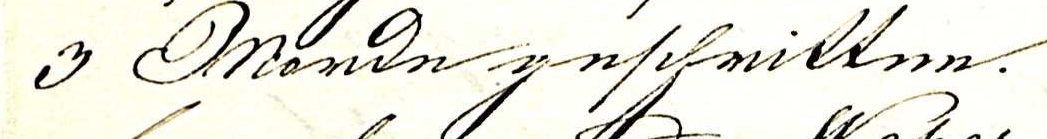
3 Morde geschritten.
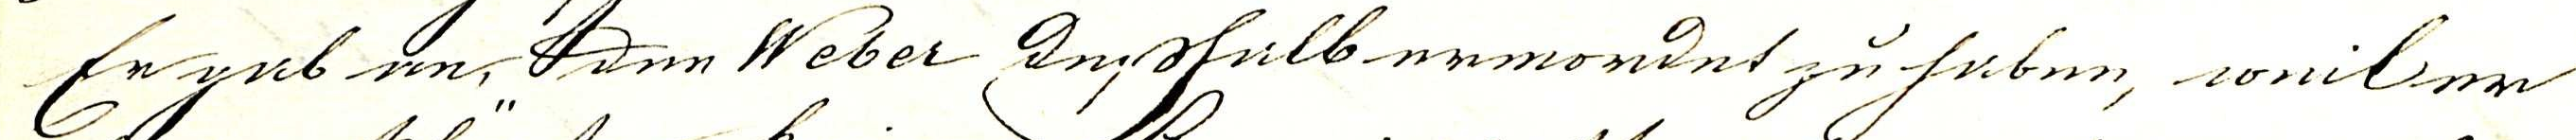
Er gab an, den Weber deßhalb ermordet zu haben, weil er
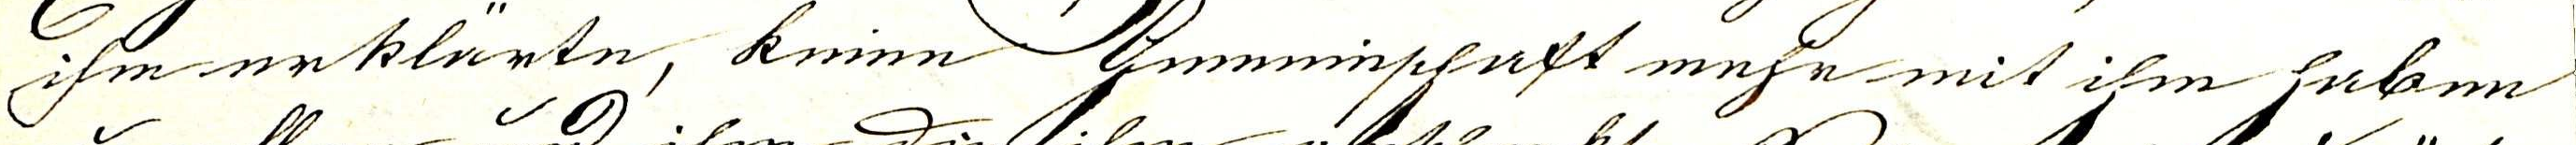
ihm erklärte, keine Gemeinschaft mehr mit ihm haben
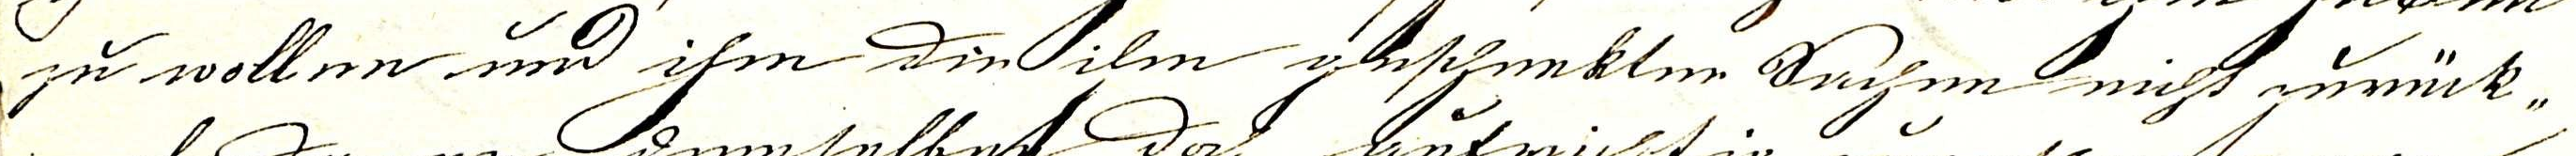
zu wollen und ihm die ihm geschenkten Sachen nicht zurück¬
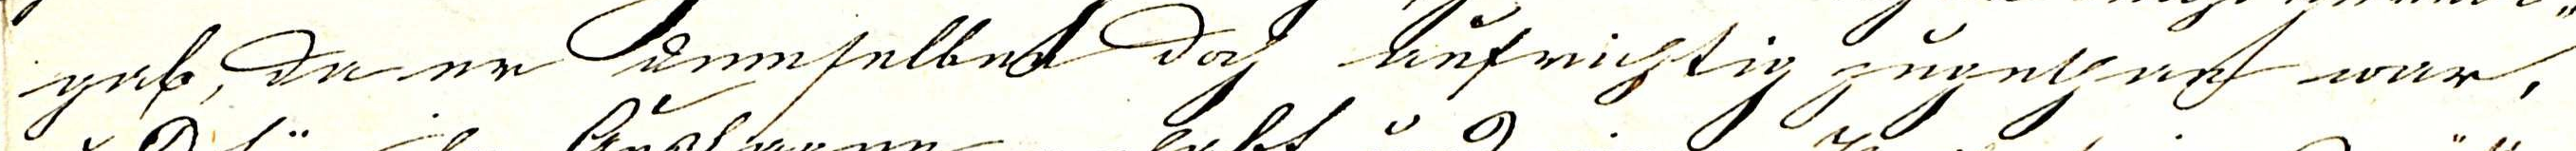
gab, da er demselben doch aufrichtig zugethan war,
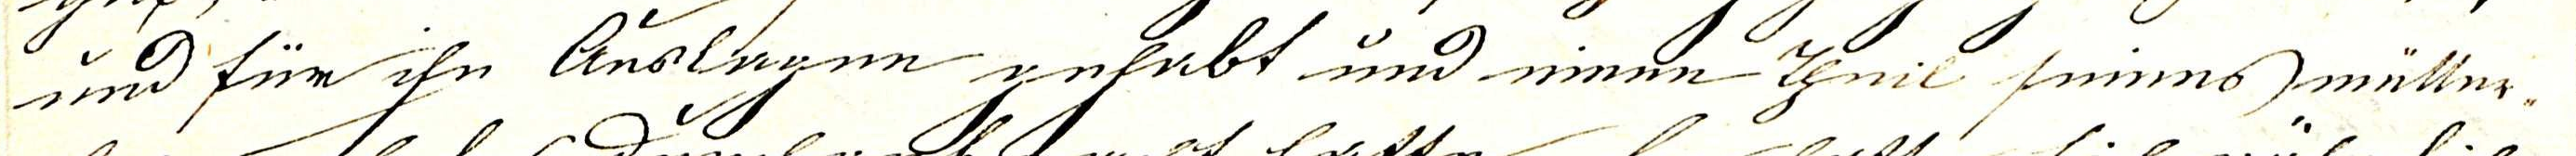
und für ihn Auslagen gehabt und einen Theil seines mutter¬
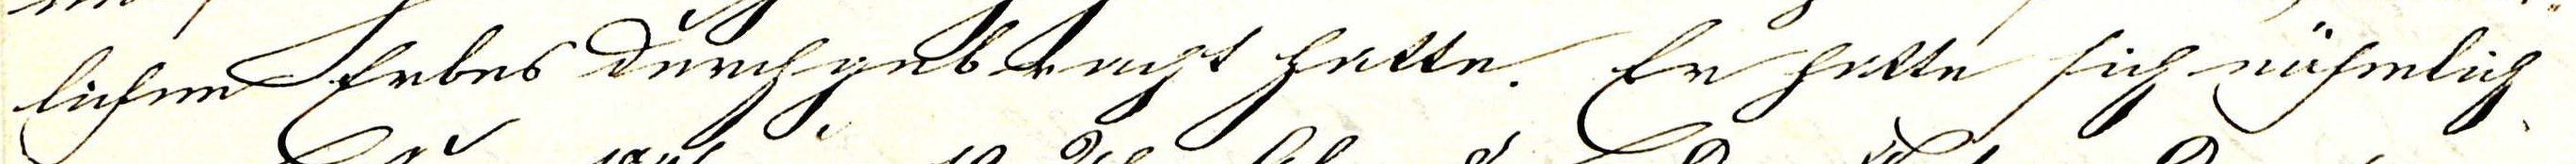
lichen Erbes durchgebracht hatte. Er hatte sich nähmlich
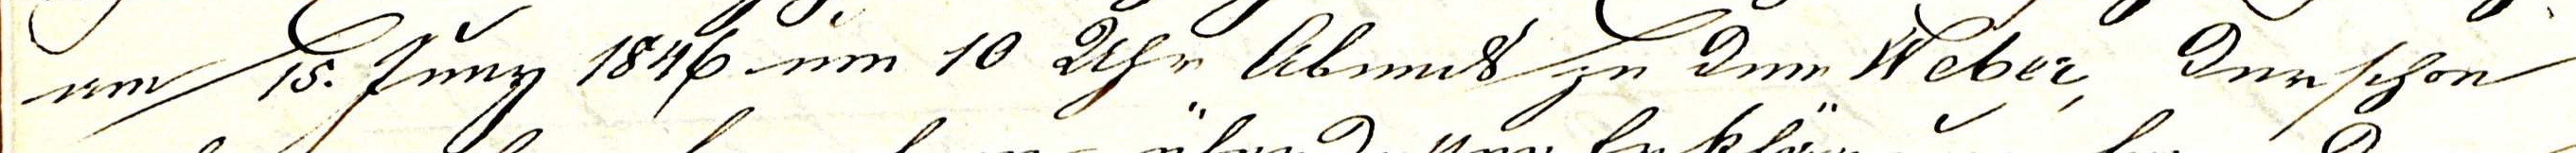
am 15. Juny 1846 um 10 Uhr Abends zu dem Weber, der schon
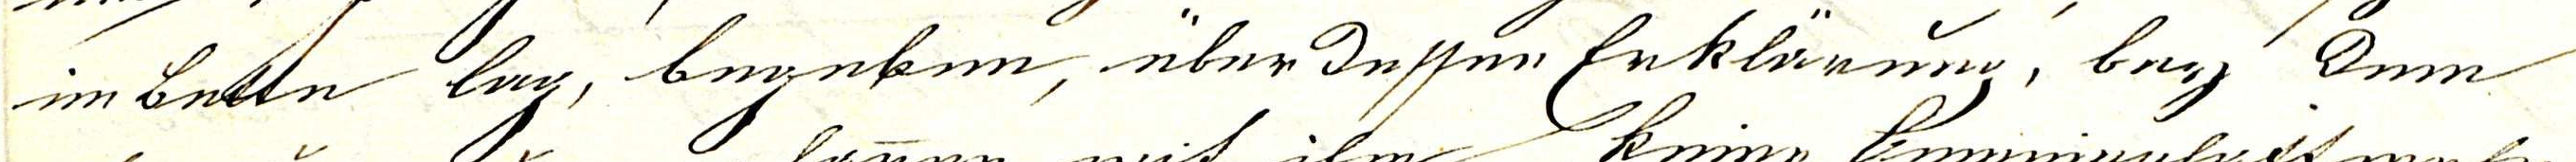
im Bette lag, begeben, über dessen Erklärung, bey dem
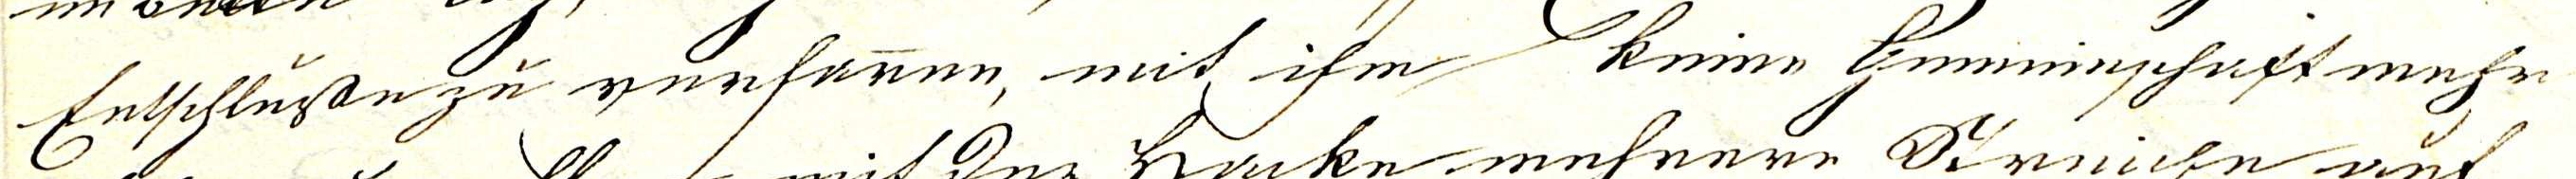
Entschluße zu verharren, mit ihm keine Gemeinschaft mehr
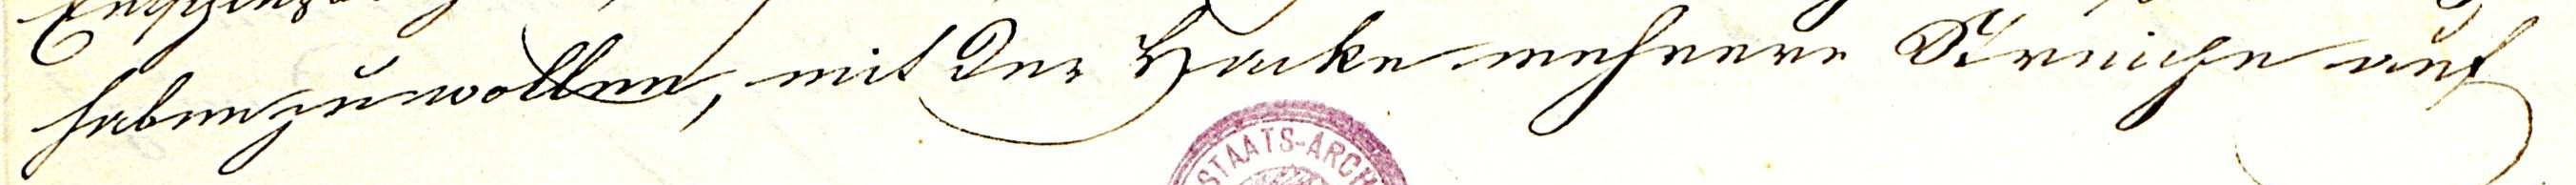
haben zu wollen, mit der Hacke mehrere Streiche auf
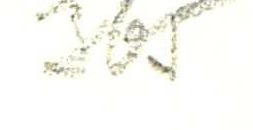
365
